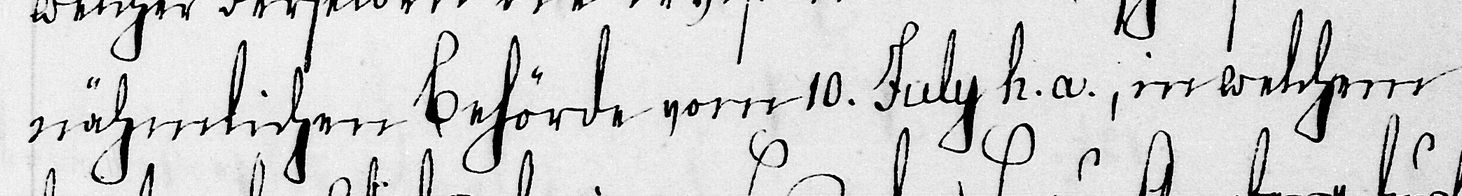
nähmlichen Behörde vom 10. July h. a., in welchem
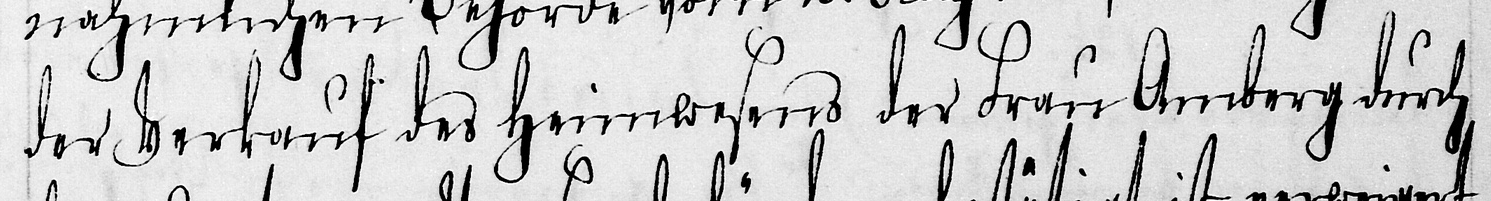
der Verkauf des Heimwesens der Frau Amberg durch
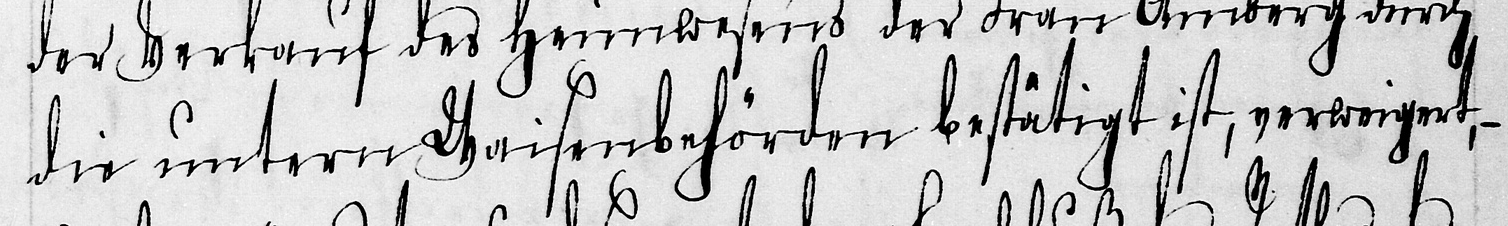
die untern Waisenbehörden bestätigt ist, verweige¬
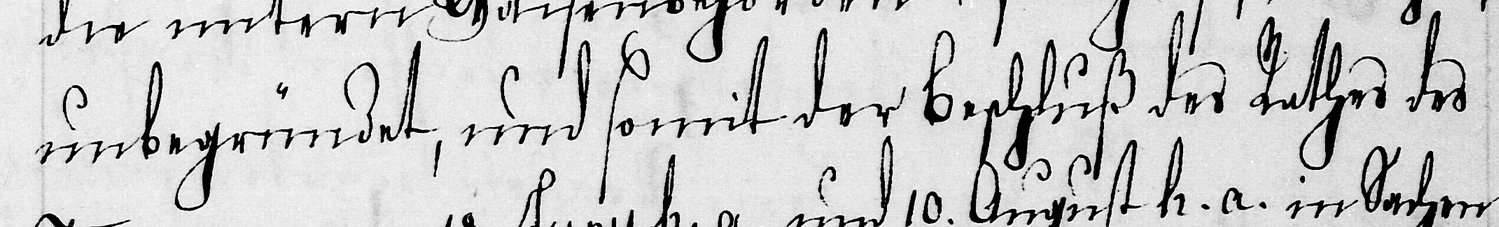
unbegründet, und somit der Beschluß des Rathes des
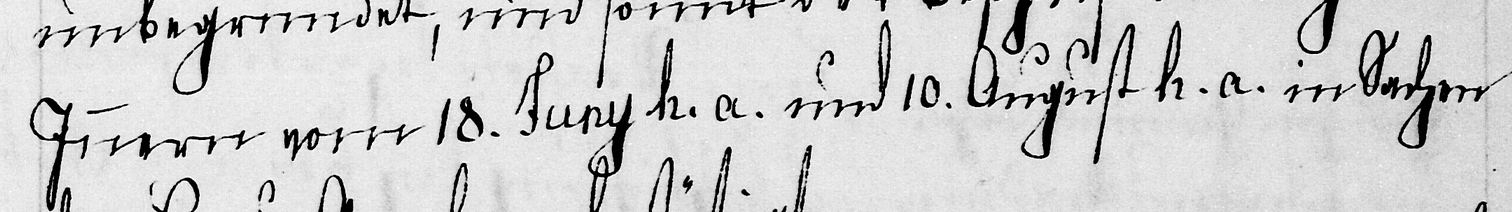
Innern vom 18. Juny h. a. und 10. August h. a. in Sachen
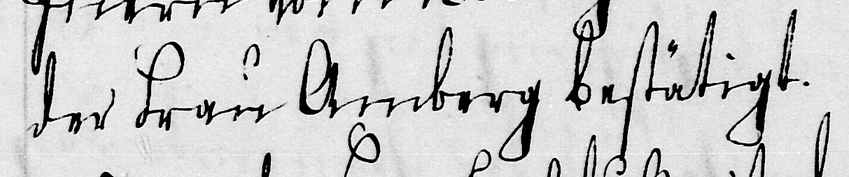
der Frau Amberg bestätigt.
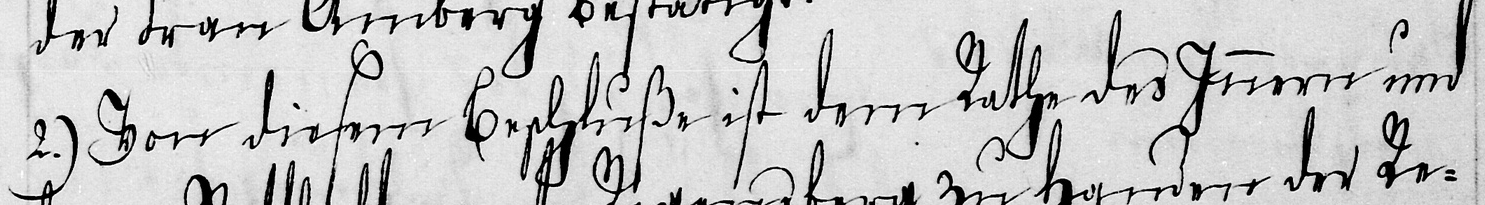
2.) Von diesem Beschluße ist dem Rathe des Innern und
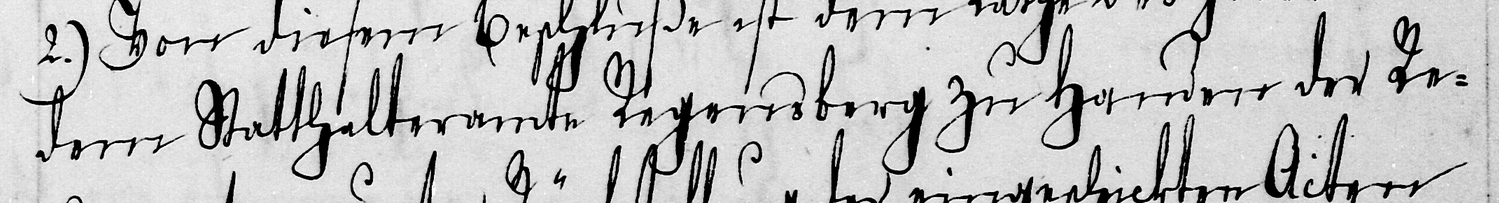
dem Statthalteramte Regensberg zu Handen der Re¬
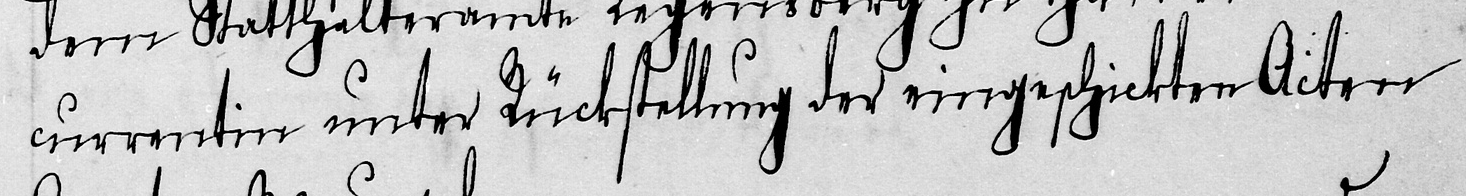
currentin unter Rückstellung der eingeschickten Acten
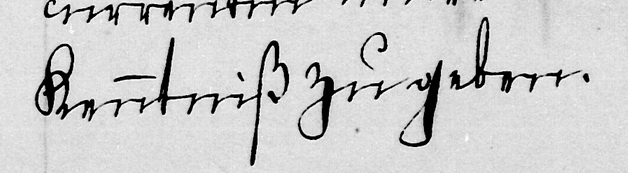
Kenntniß zu geben.
